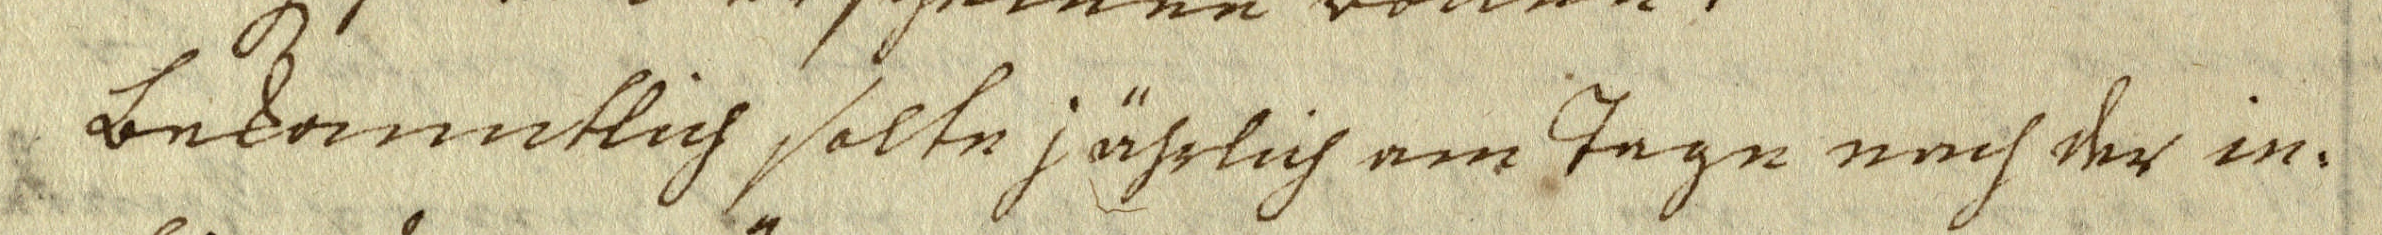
Bekanntlich solte jährlich am Tage nach der in¬
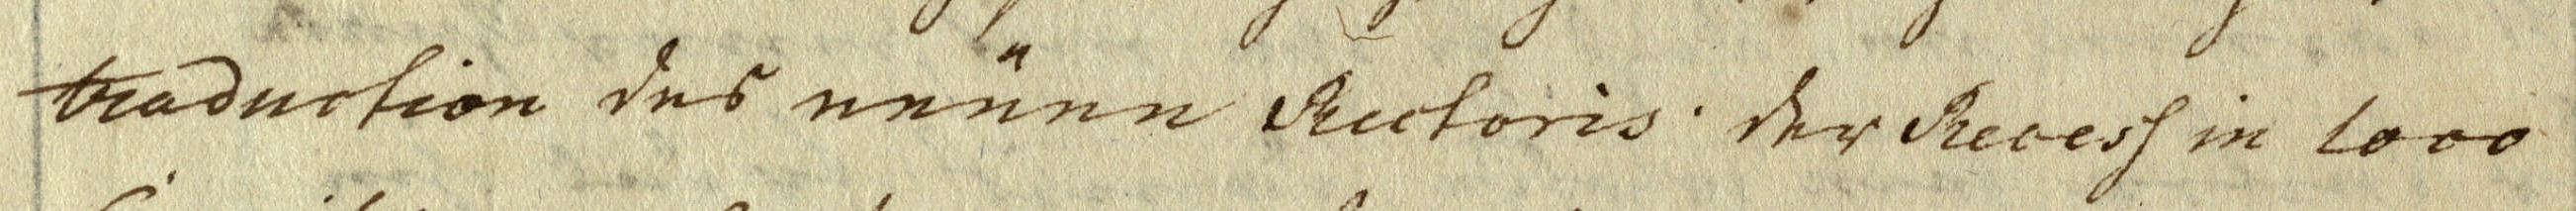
troduction des neuen Rectoris der Recess in loco
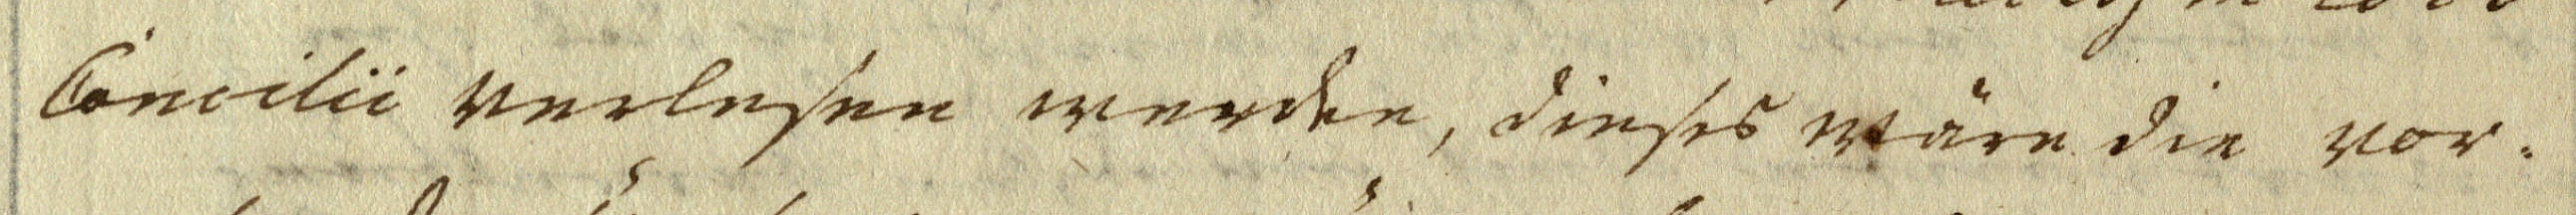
Concilii verlesen werden, dieses wäre die vor¬
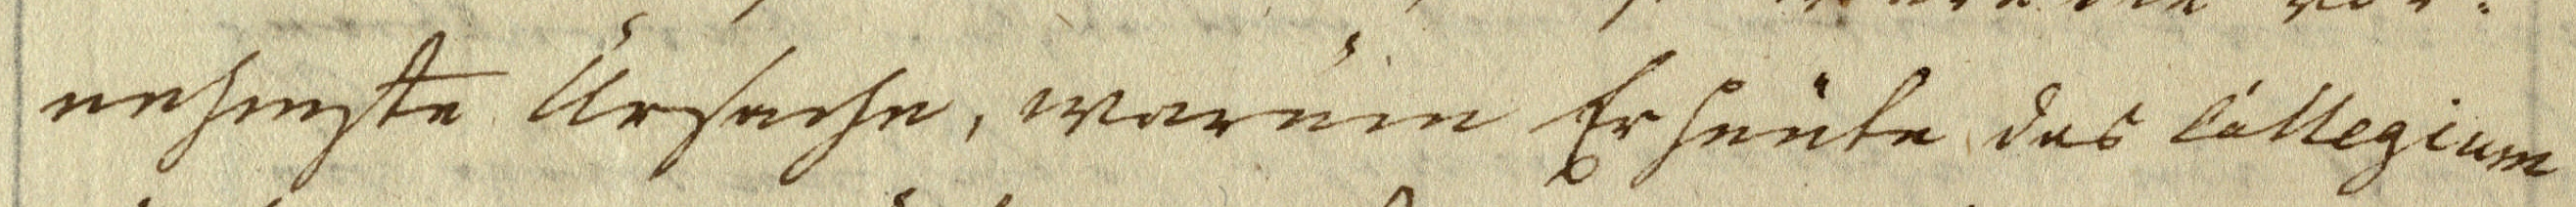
nehmste Ursache, warum Er heute das Collegium
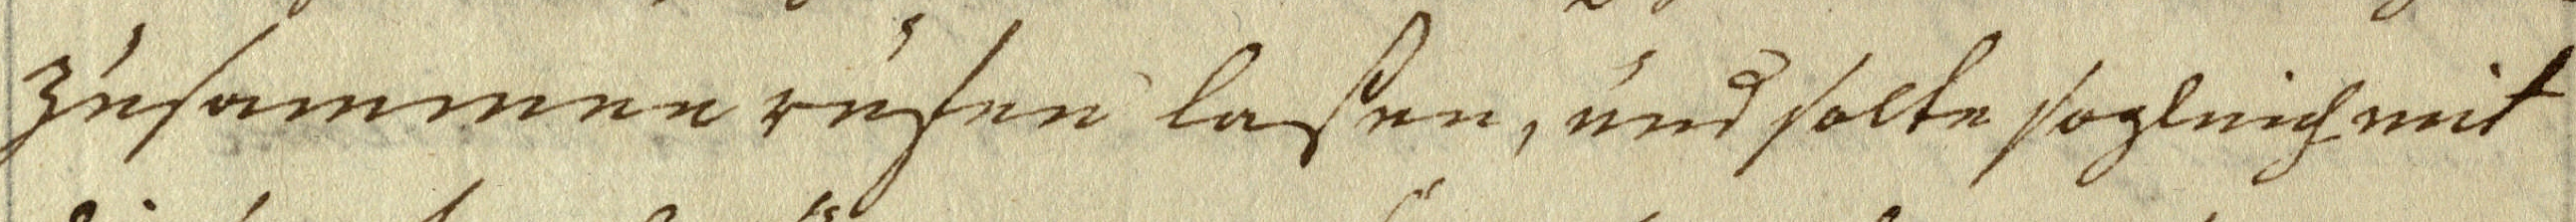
zusammen rufen laßen, und solte sogleich mit
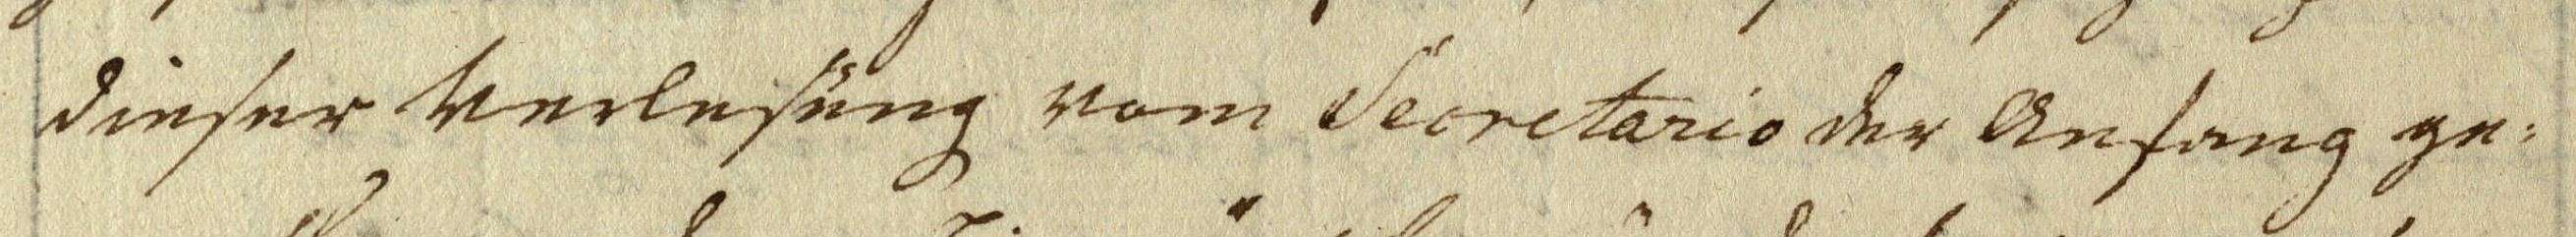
dieser Verlesung vom Secretario der Anfang ge¬
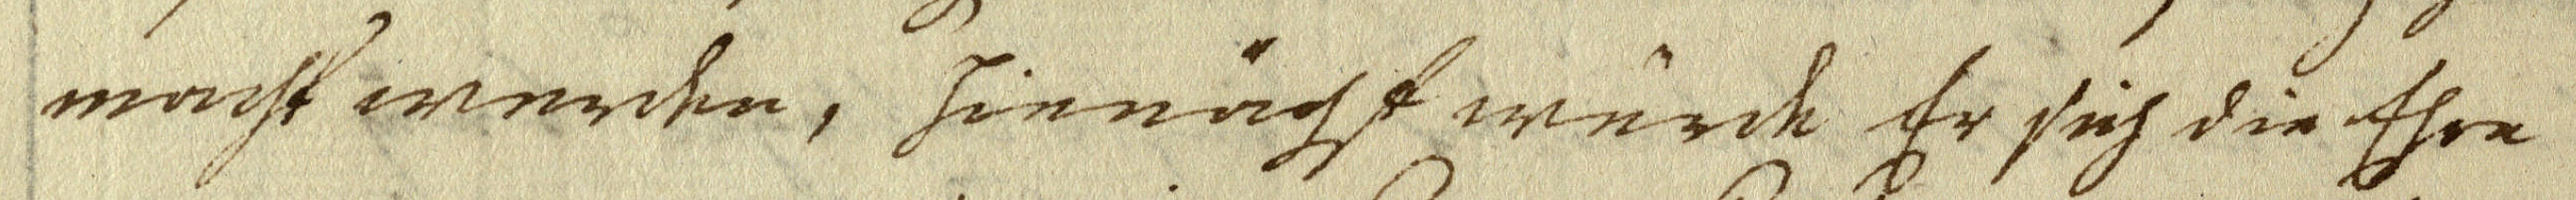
macht werden, hienächst würde Er sich die Ehre
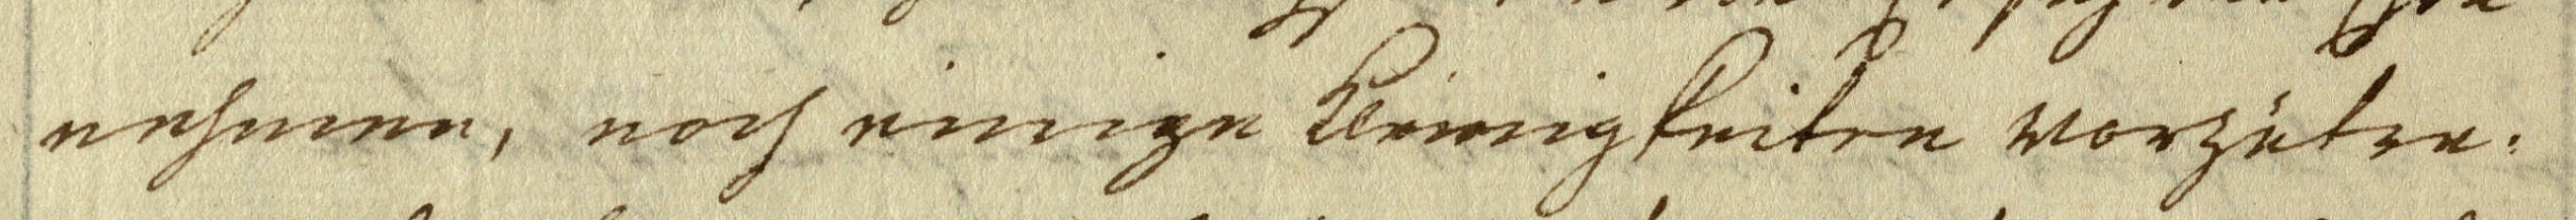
nehmen, noch einige Kleinigkeiten vorzutra¬
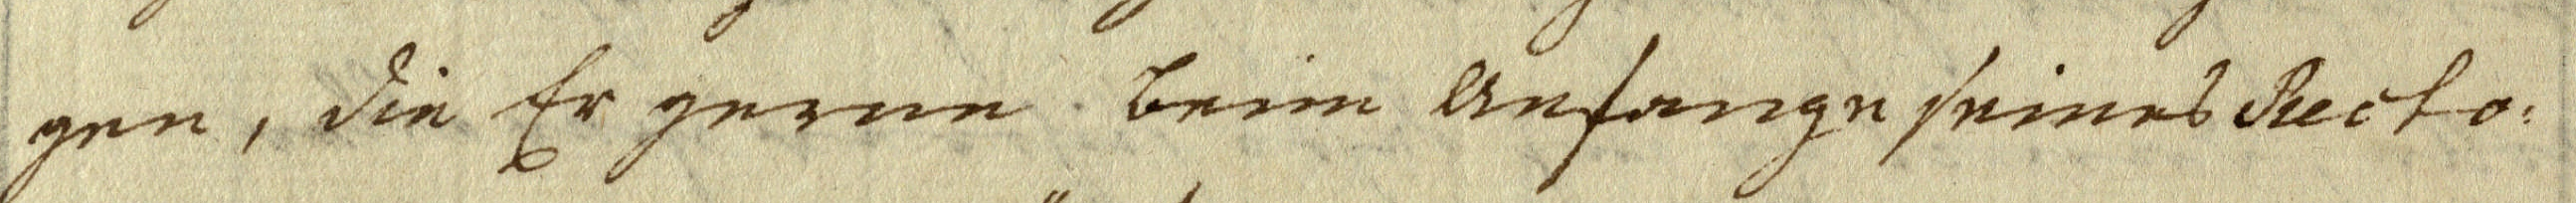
gen, die Er gerne beim Anfange seines Recto¬
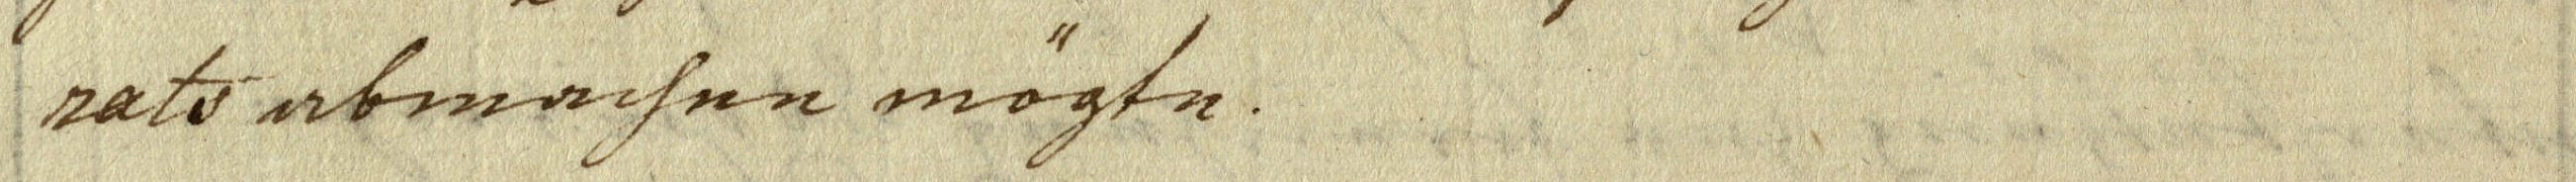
rats abmachen mögte.
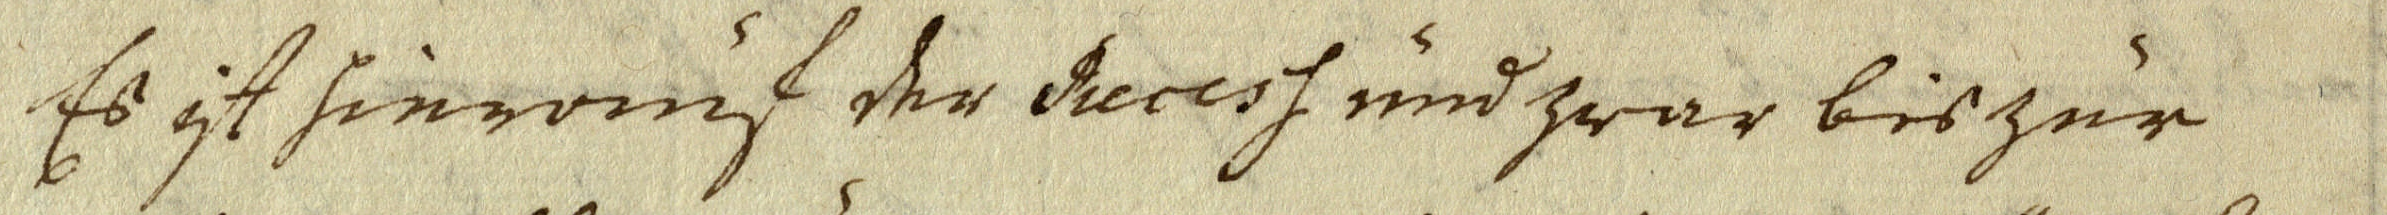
Es ist hierauf der Recess und zwar bis zur
